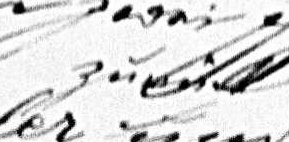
zurück
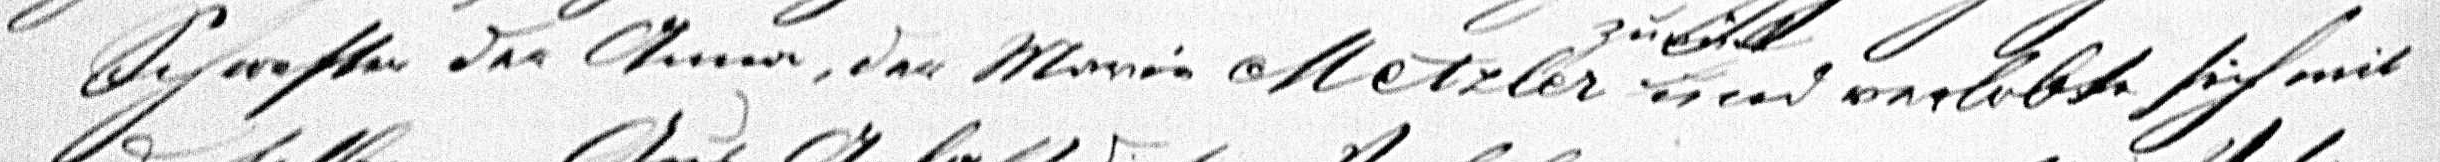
Schwester der Anna, der Maria Metzler und verlobte sich mit
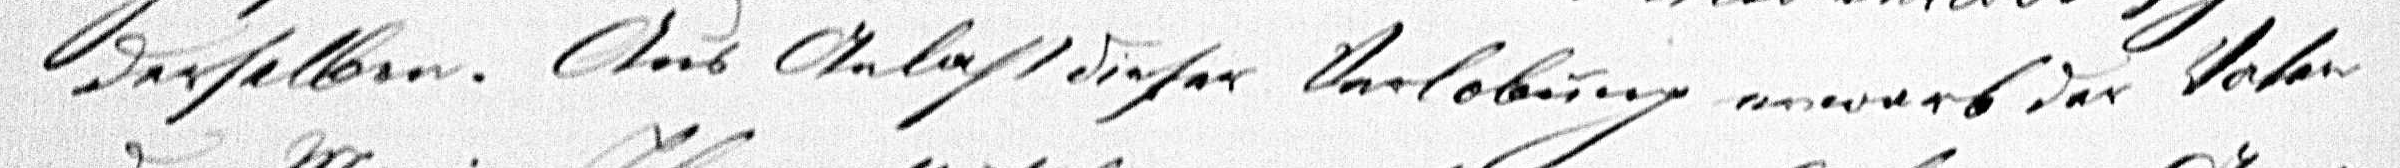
derselben. Aus Anlaß dieser Verlobung erwarb der Vater
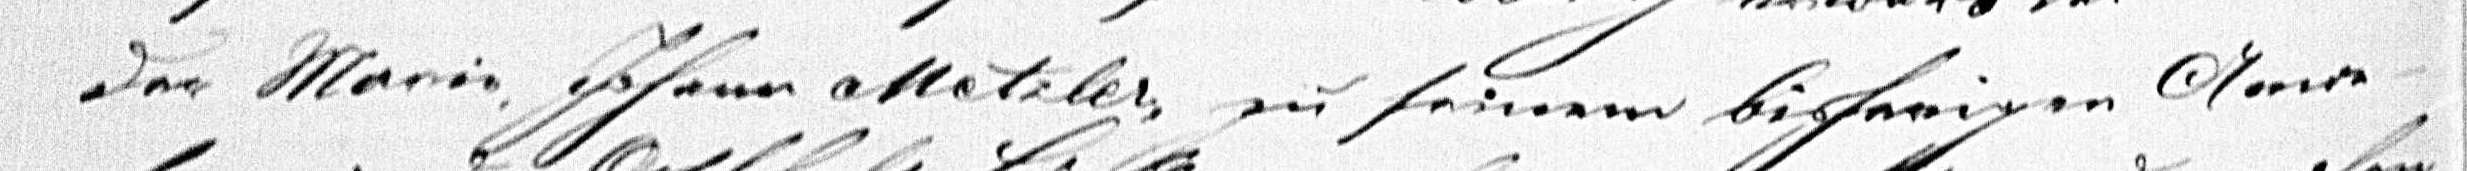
der Marie, Johann Metzler, zu seinem bisherigen Anwe¬
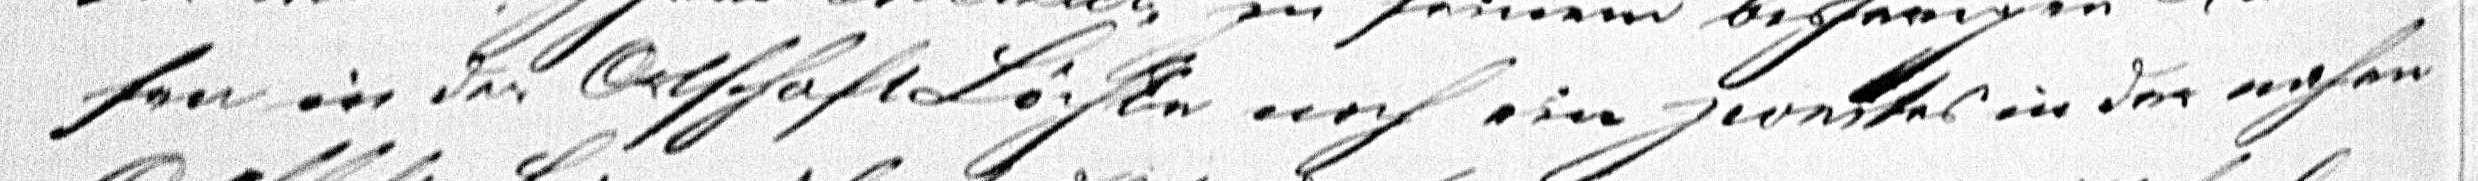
sen in der Ortschaft Löchte noch ein zweites in er nahen
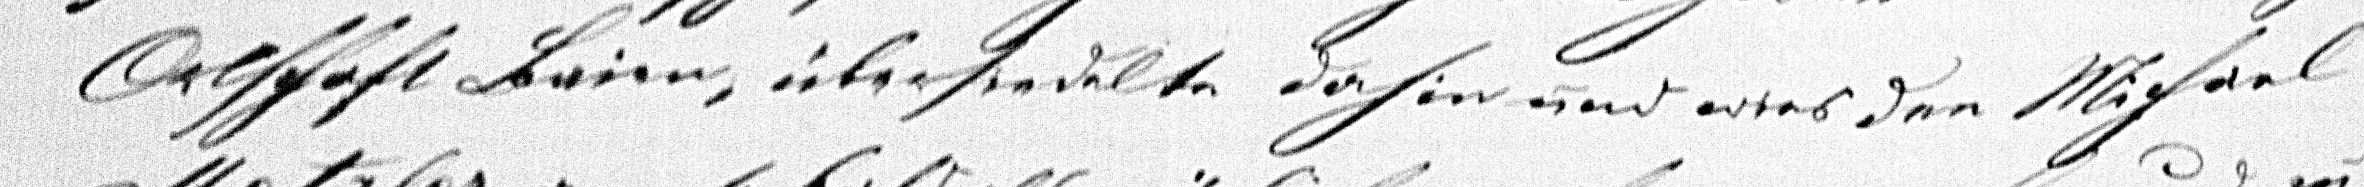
Ortschaft Baim, übersiedelte dahin und wies den Michael
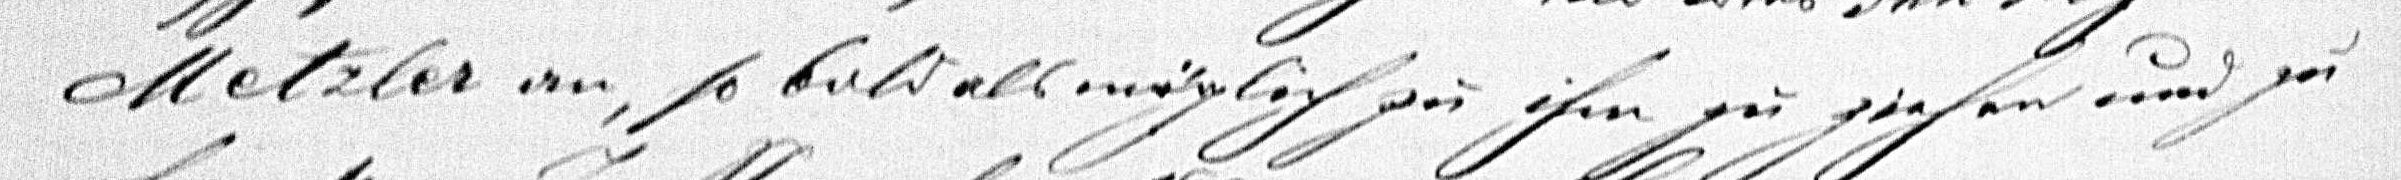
Metzler an, so bald als möglich zu ihm zu ziehen und zu
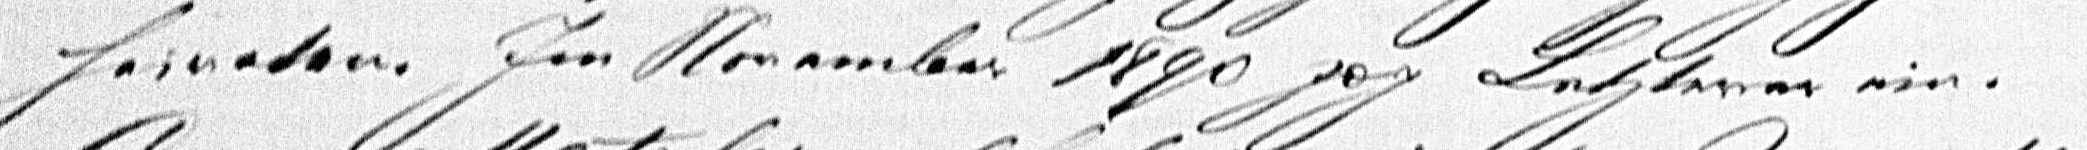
heiraten. Im November 1890 zog Letzterer ein.
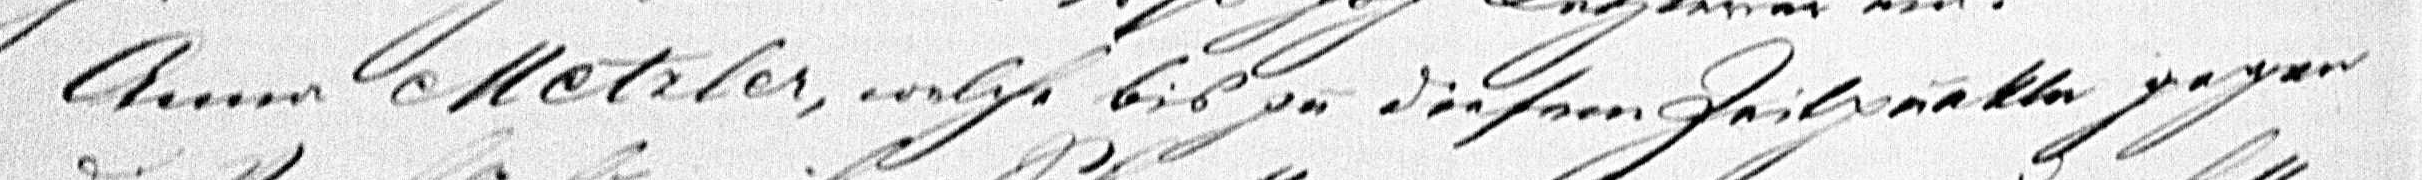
Anna Metzler, welche bis zu diesem Zeitpunkte gegen
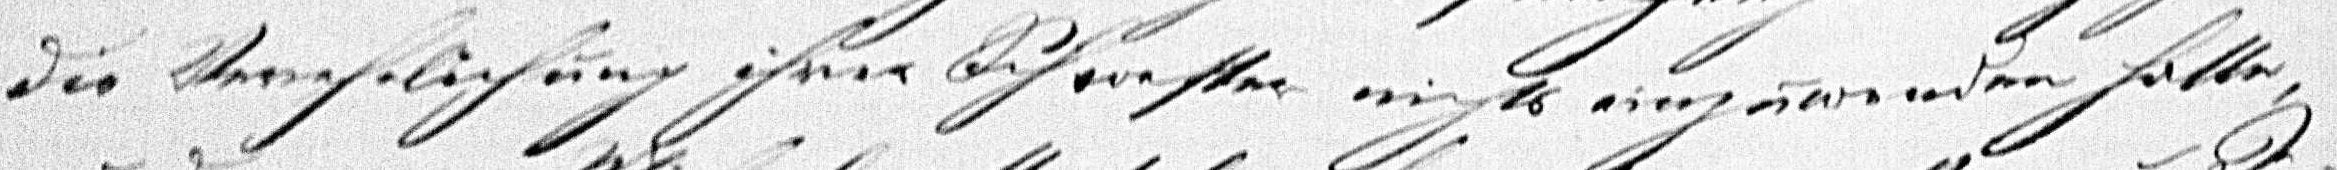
die Verehelichung ihrer Schwester nichts einzuwenden hatte,
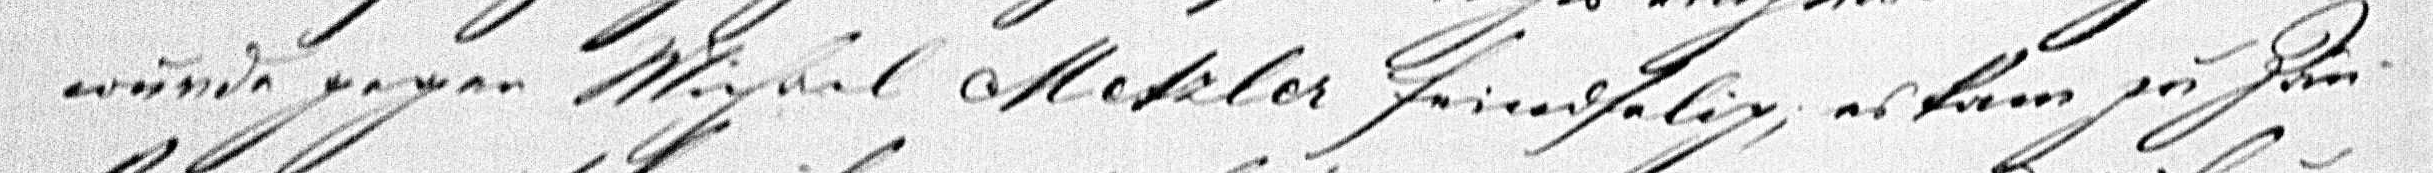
wurde gegen Michael Metzler feindselig; es kam zu Zan¬
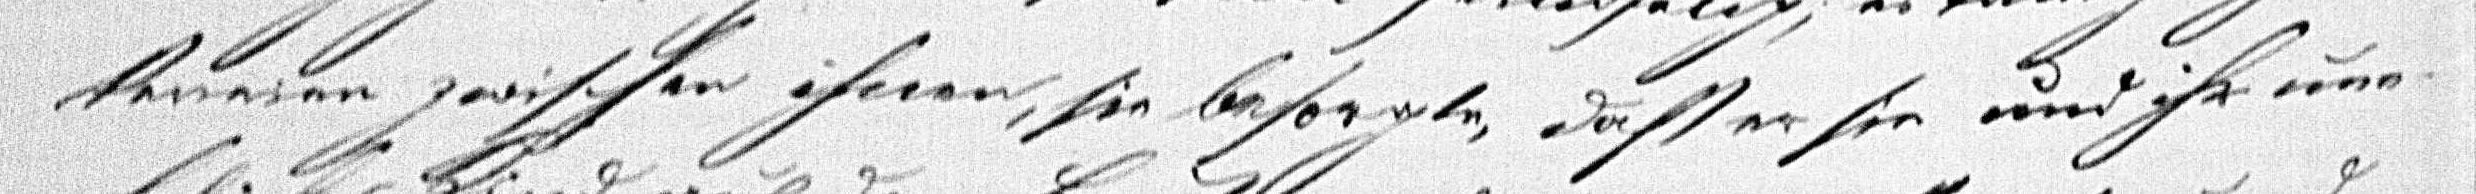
kereien zwischen ihnen, sie besorgte, daß er sie und ihr une¬
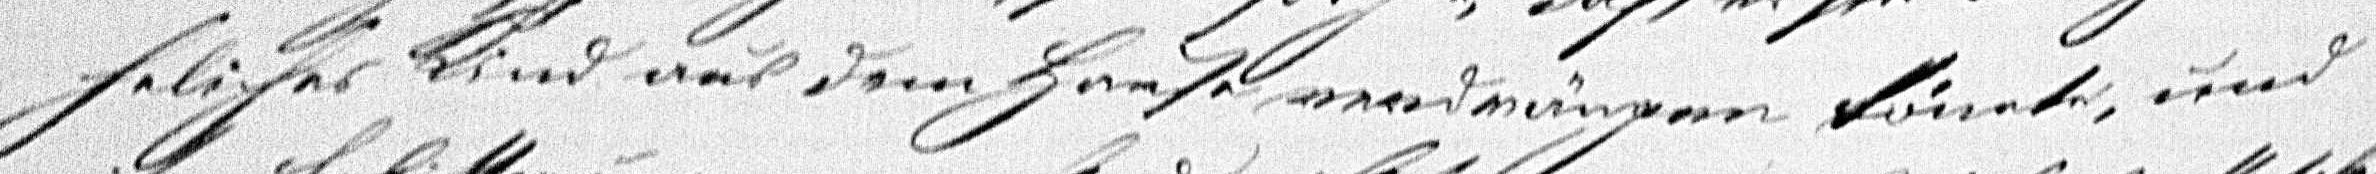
heliches Kind aus dem Hause verdrängen könnte, und
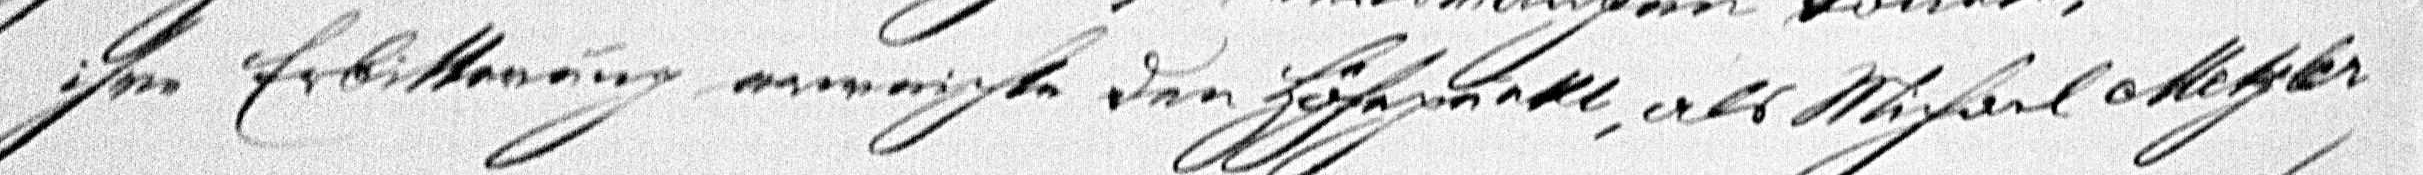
ihre Erbitterung erreichte den Höhepunkt, als Michael Metzler
